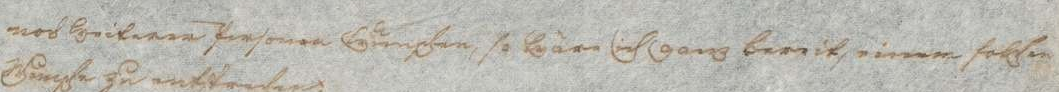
noch weiterer Personen wünschen, so wäre ich ganz bereit einem solchen
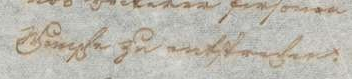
Wunsche zu entsprechen.
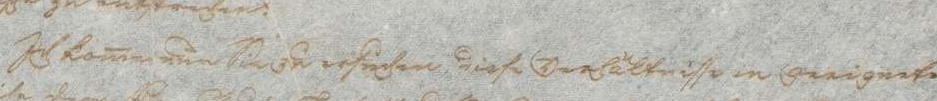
Ich komme nun Sie zu ersuchen, diese Verhältnisse in geeigneter
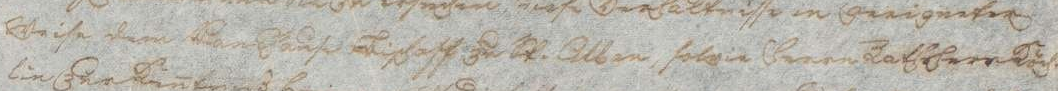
Weise dem Bankhause Bischoff zu St. Alban, sowie Herrn Rathsherr Köch-
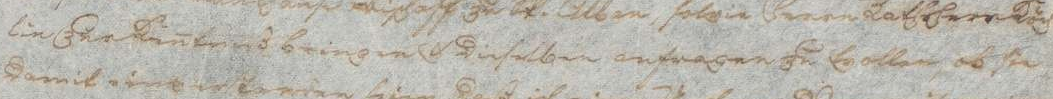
lin zur Kenntniß bringen & dieselben anfragen zu wollen, ob sie
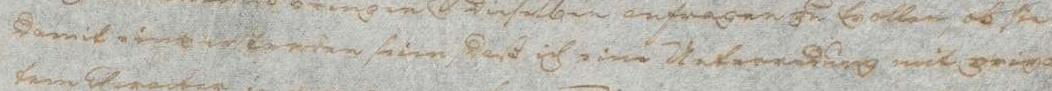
damit einverstanden seien, daß ich eine Unterredung mit priva-
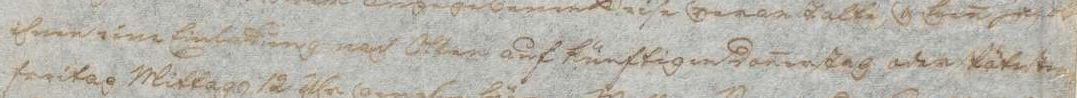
ihnen eine Einladung nach Olten auf künftigen Donnerstag oder spätestens
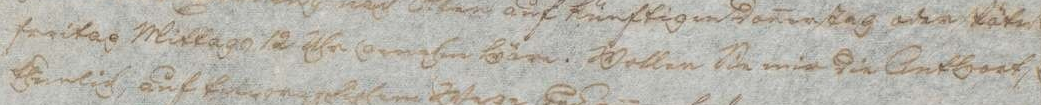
Freitag Mittags 12 Uhr genehm wäre. Wollen Sie mir die Antwort,
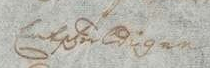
Entschuldigen
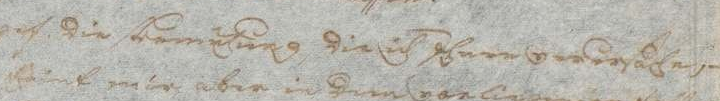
gef. die Bemühung, die ich Ihnen verursache,
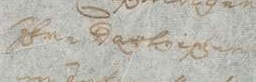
Ihre Dazwischenkunft
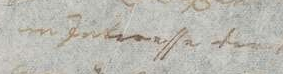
im Interesse der
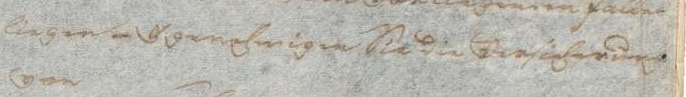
Sache zu liegen – & genehmigen Sie die Versicherung
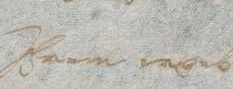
Ihrem ergebenen
